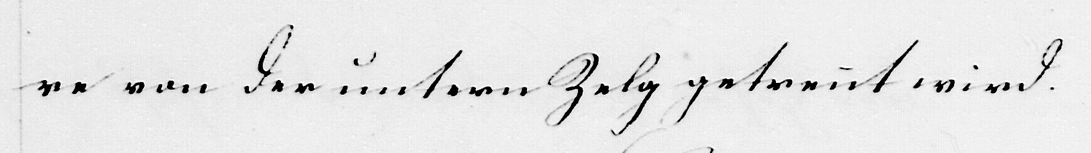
re von der untern Zelg getrennt wird.
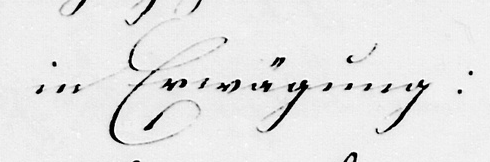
in Erwägung:
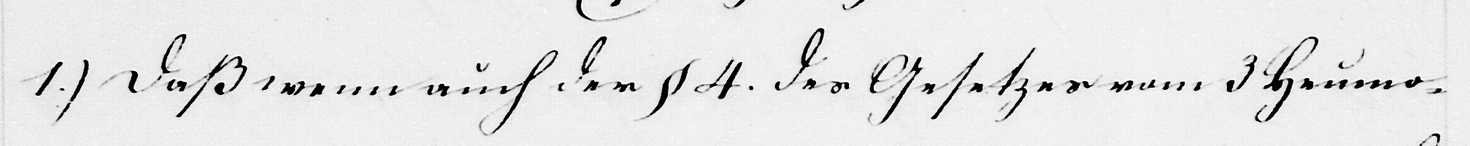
1.) Daß wenn auch der § 4. des Gesetzes vom 3 Heumo¬
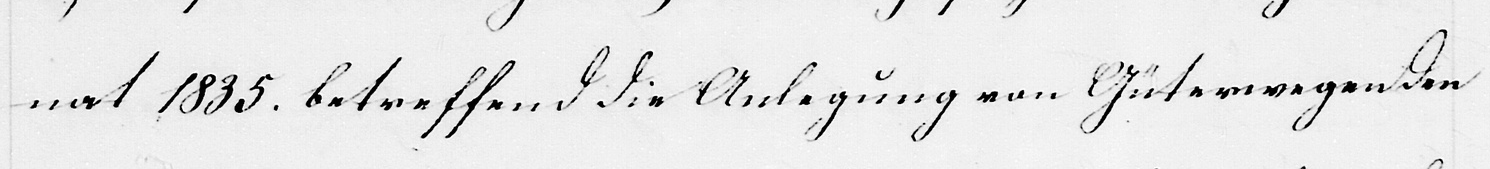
nat 1835. betreffend die Anlegung von Güterwegen den
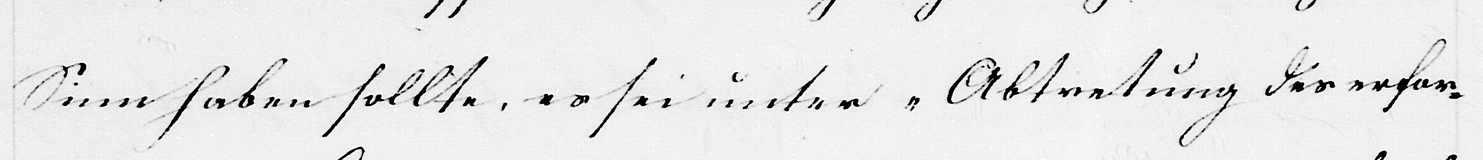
Sinn haben sollte, es sei unter „Abtretung des erfor¬
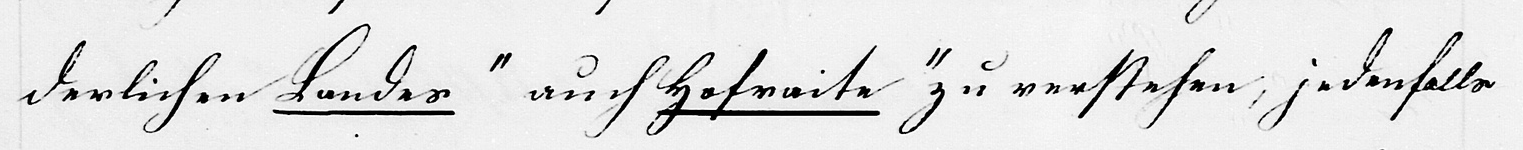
derlichen Landes“ auch [„]Hofraite“ zu verstehen, jedenfalls
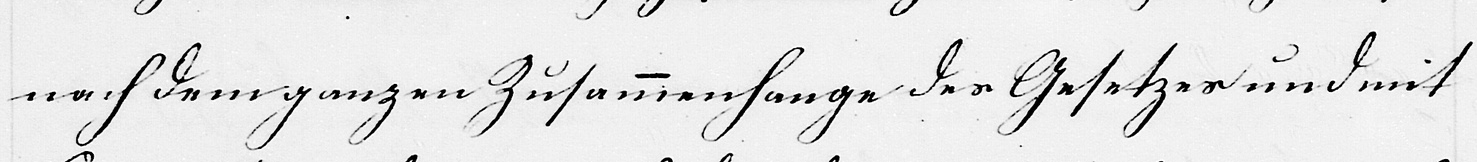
nach dem ganzen Zusammenhange des Gesetzes und mit
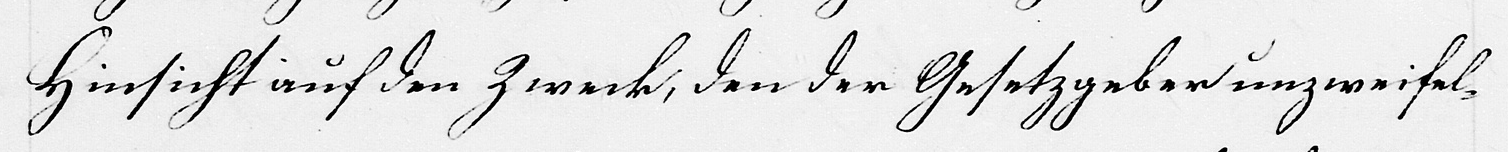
Hinsicht auf den Zweck, den der Gesetzgeber unzweifel¬
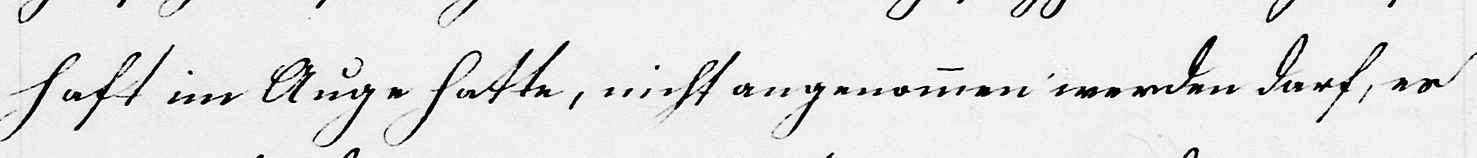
haft im Auge hatte, nicht angenommen werden darf, es
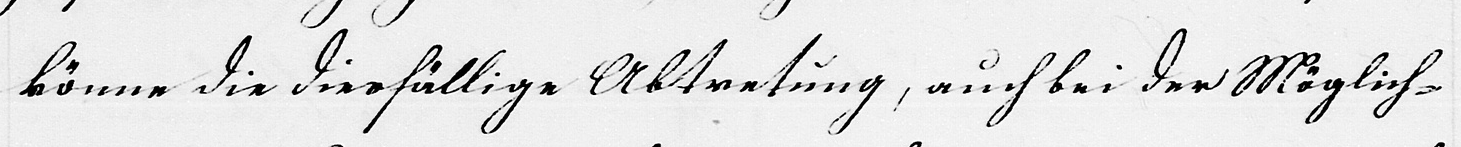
könne die diesfällige Abtretung, auch bei der Möglich¬
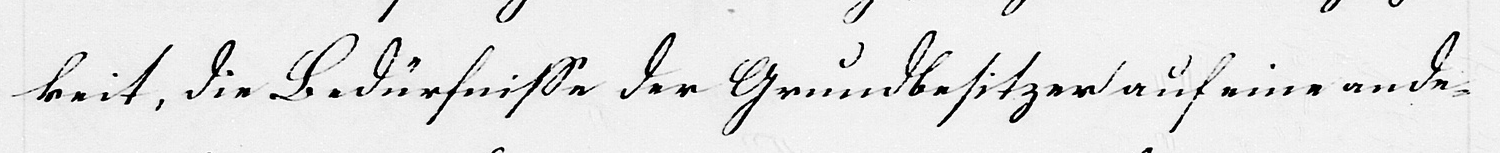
keit, die Bedürfniße der Grundbesitzer auf eine ande¬
